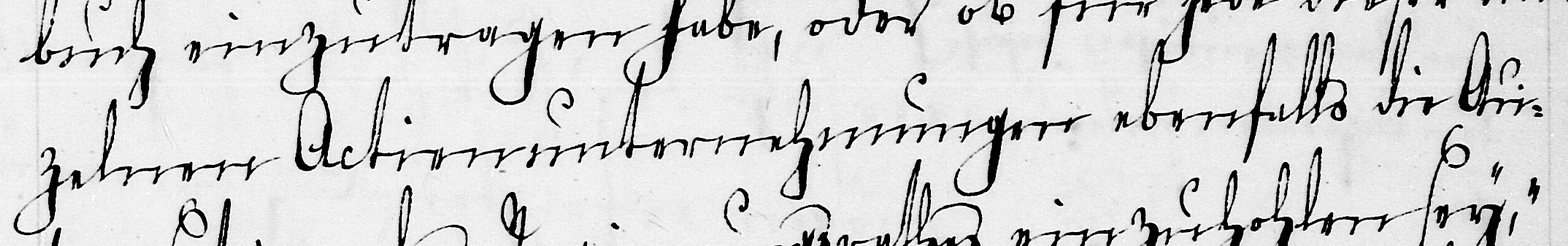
zelnen Actienunternehmungen ebenfalls die Au¬
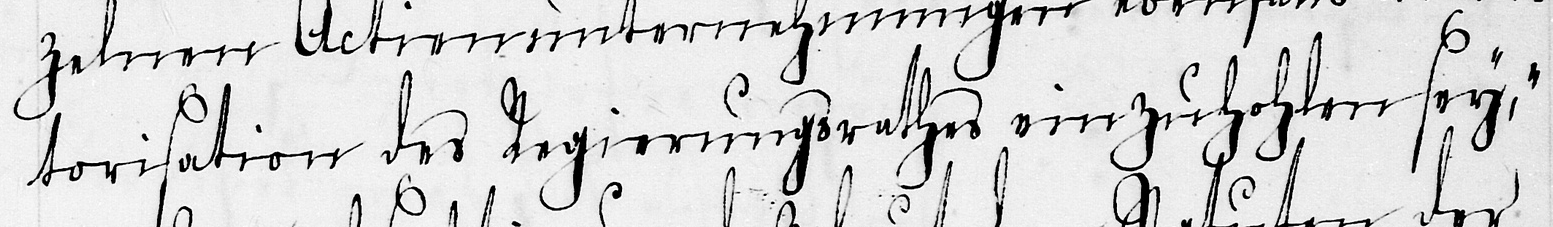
torisation des Regierungsrathes einzuhohlen sey,“
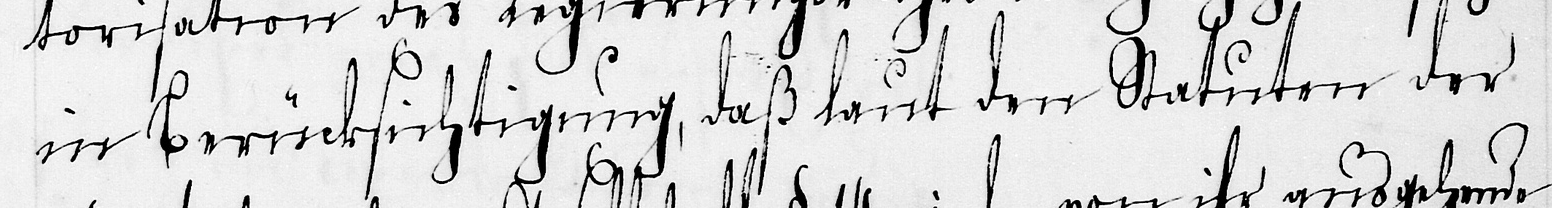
in Berücksichtigung, daß laut den Statuten der
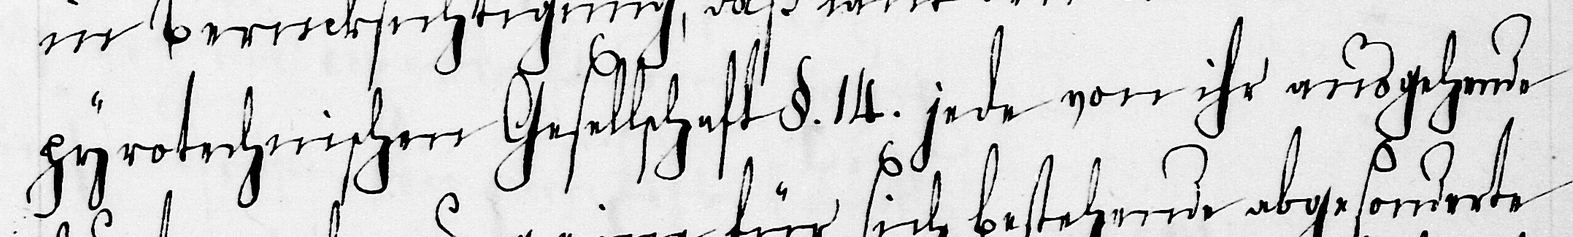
pyrotechnischen Gesellschaft §. 14. jede von ihr ausgehende
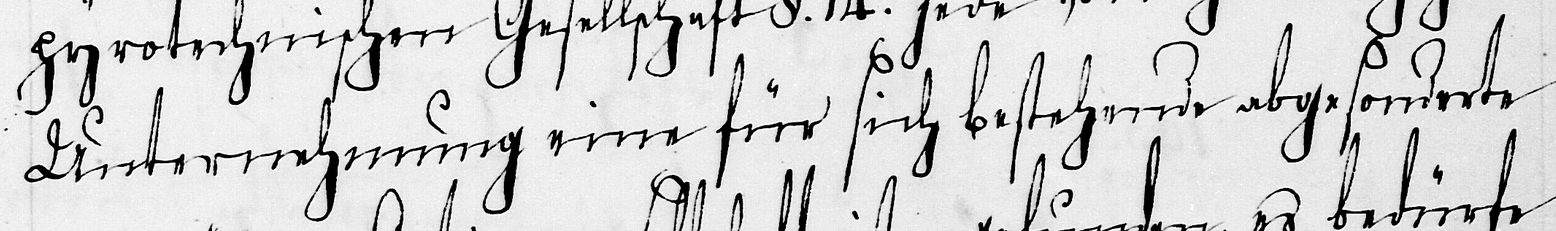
Unternehmung eine für sich bestehende abgesonderte
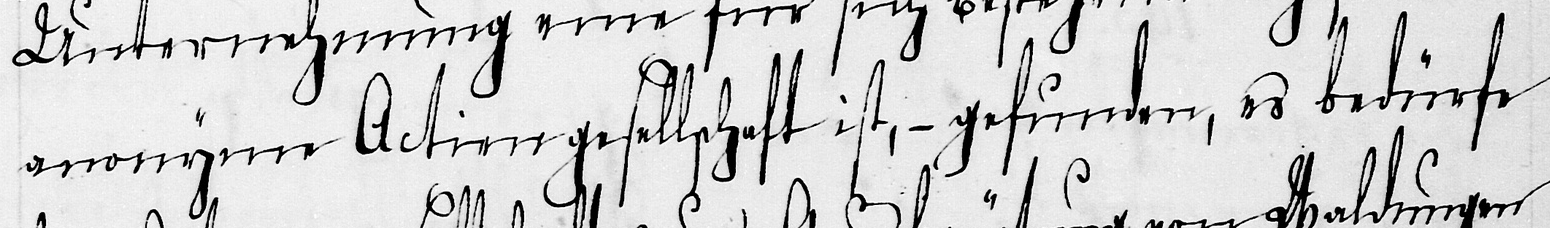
anonyme Actiengesellschaft ist, – gefunden, es bedürfe
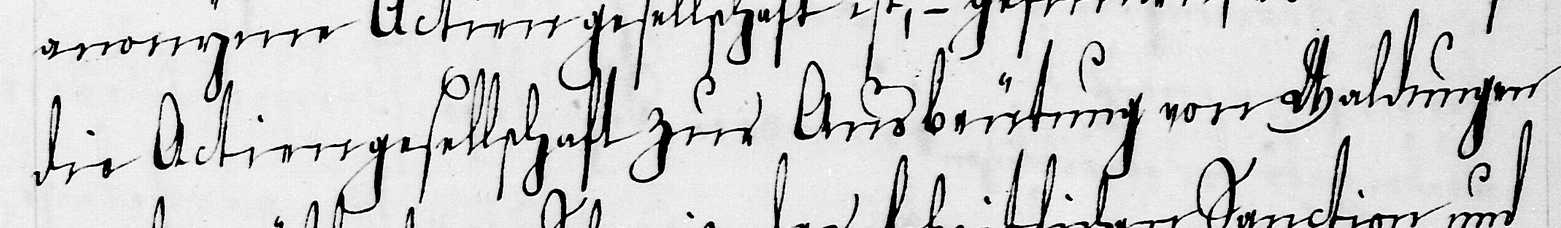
die Actiengesellschaft zur Ausbeutung von Waldungen
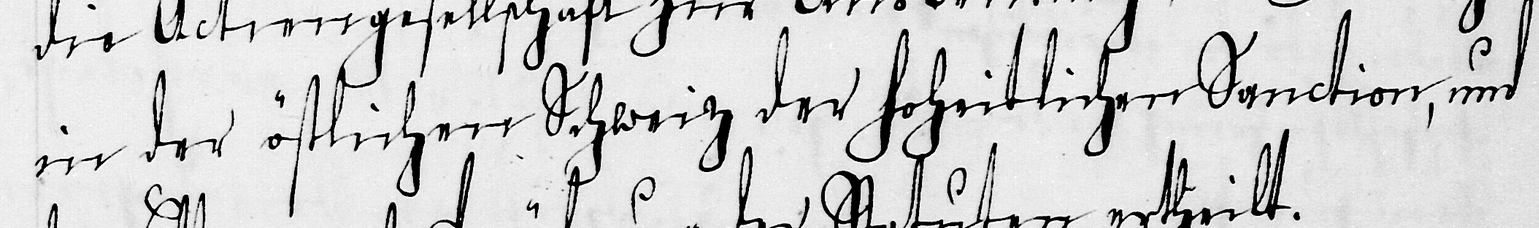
in der östlichen Schweiz der hoheitlichen Sanction, und
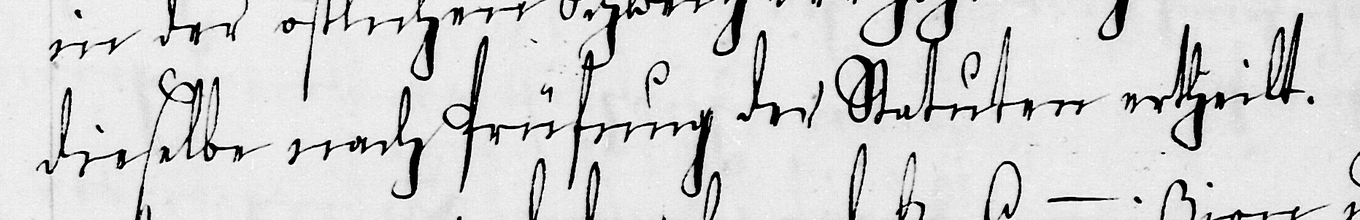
dieselbe nach Prüfung der Statuten ertheilt.
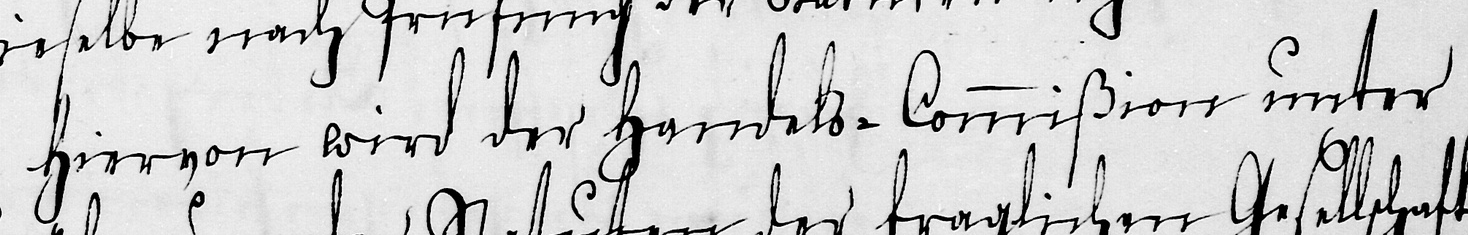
Hiervon wird der Handels-Commißion unter
